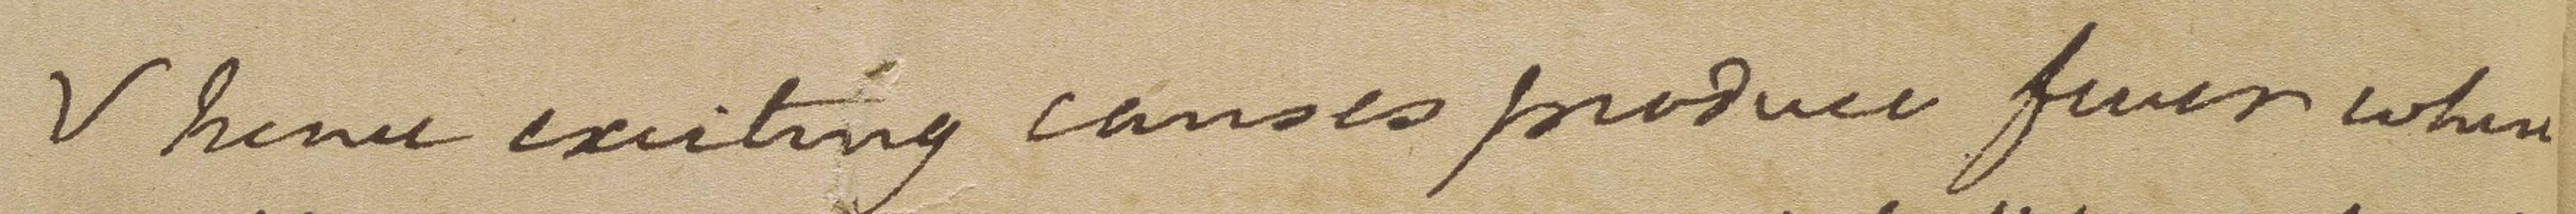V hence exciting causes produce fever when
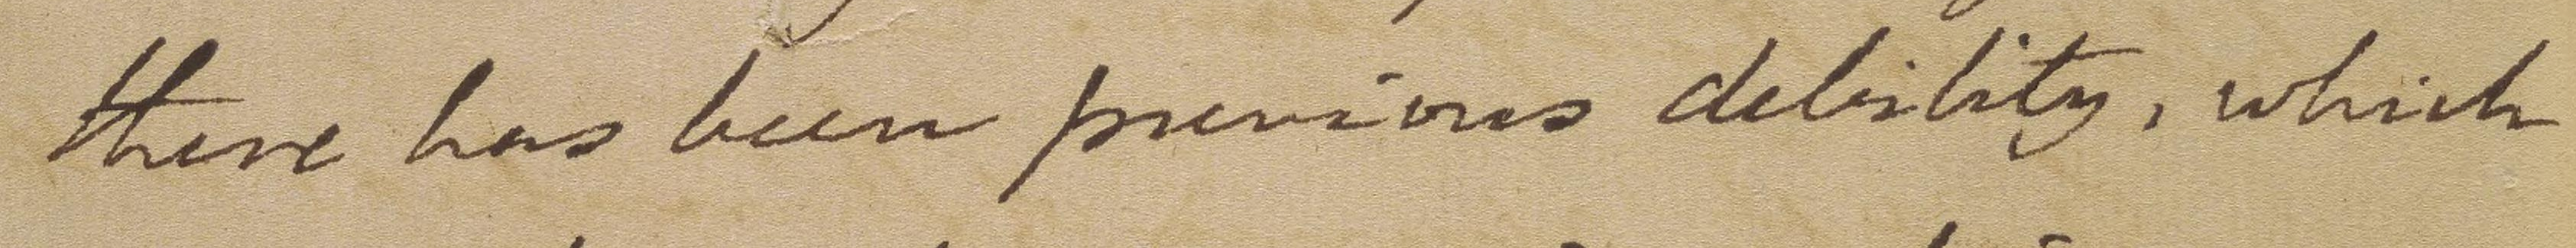there has been previous debility, which
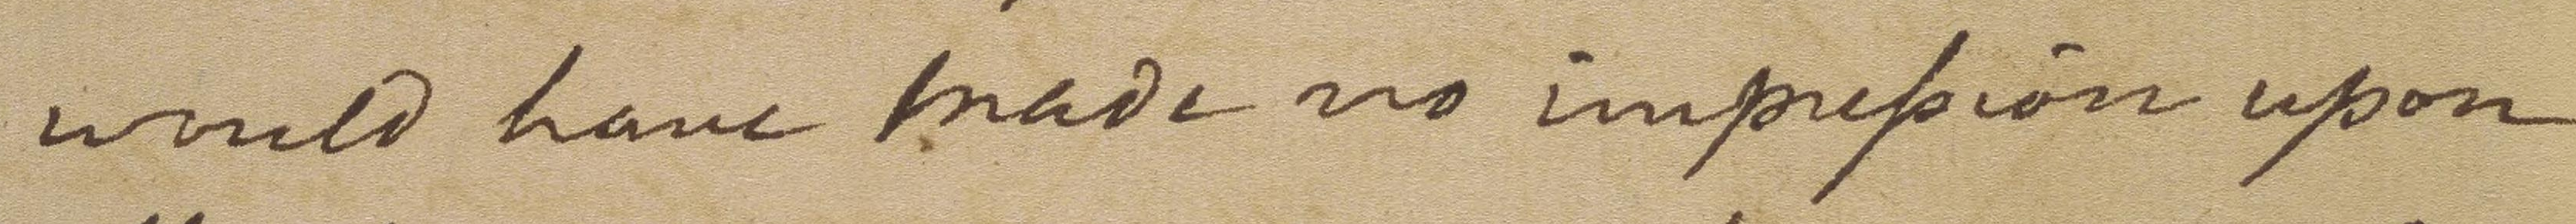would have made no impression upon
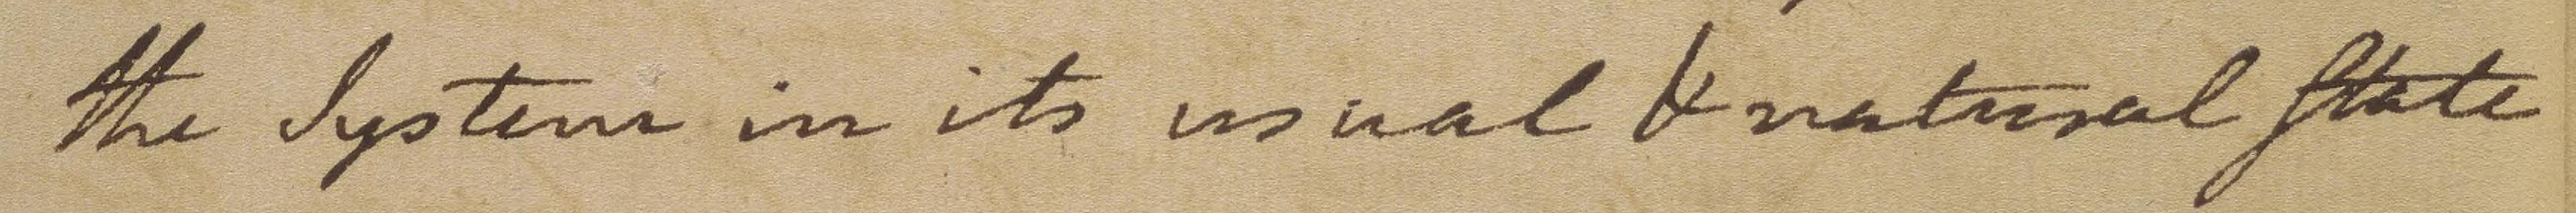the System in its usual & natural state
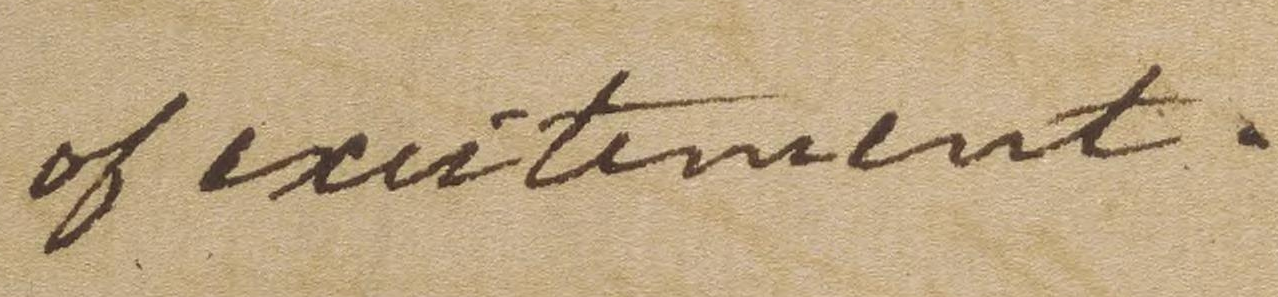of excitement.
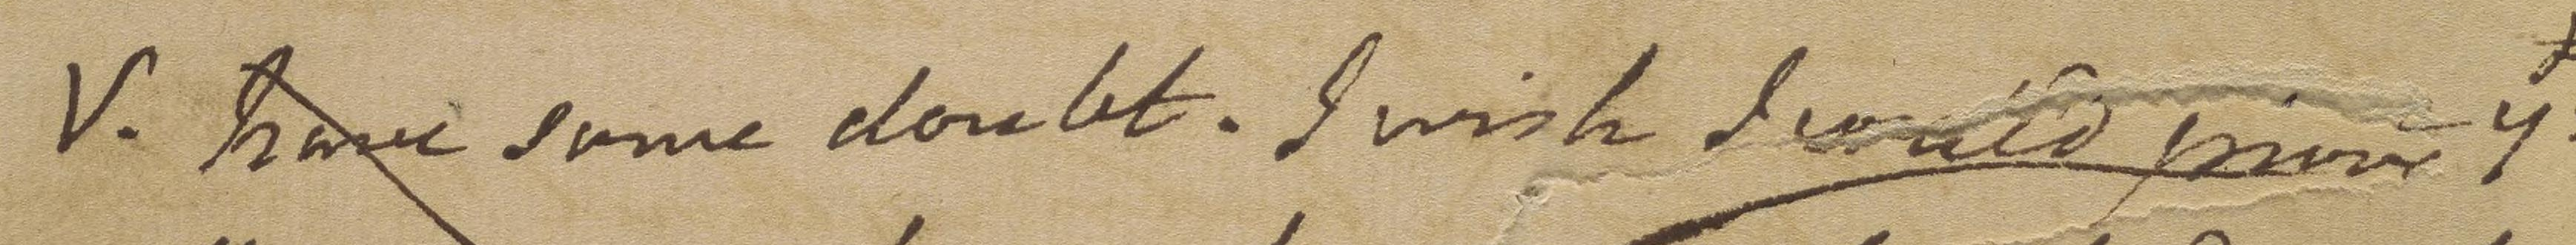V I have some doubt. I wish I would move - y^t
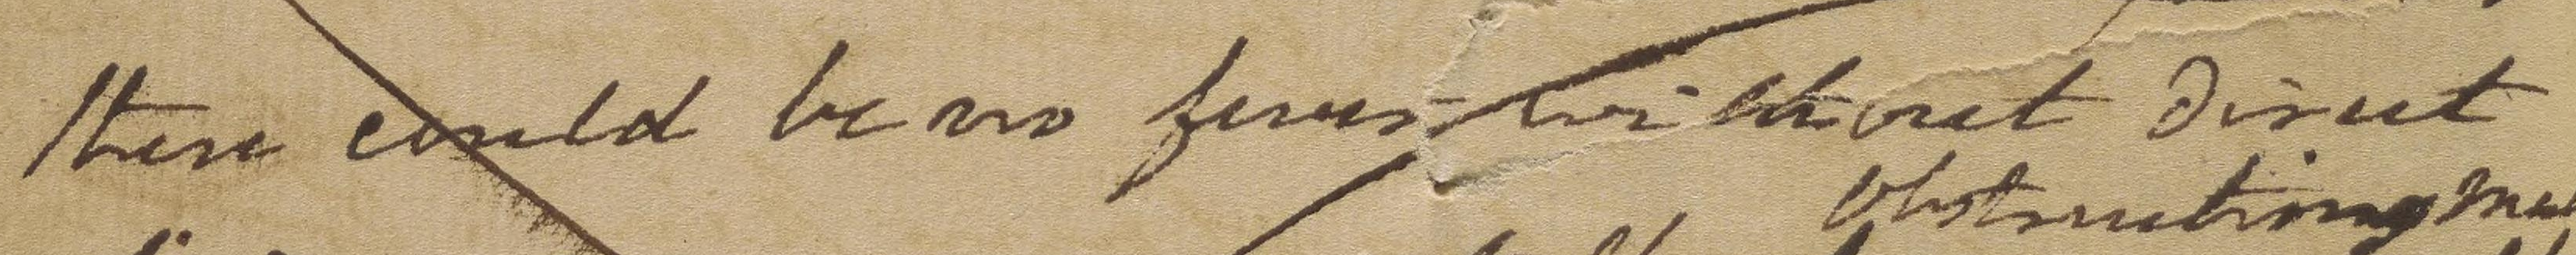there could be no fever, without direct
